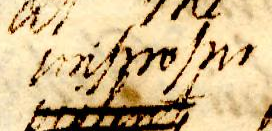Improper
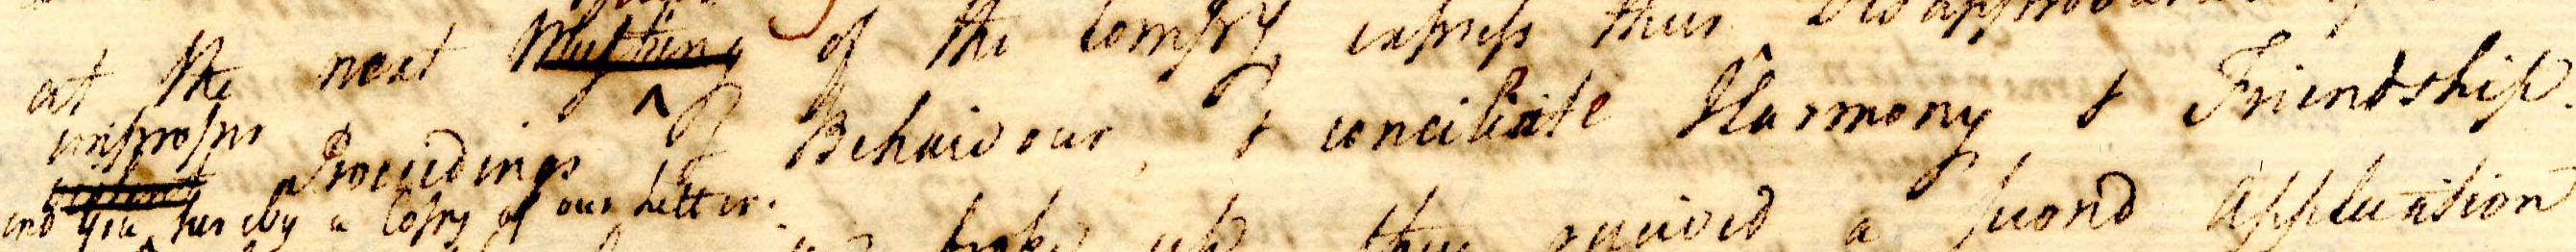violent ^ Proceedings & Behaviour & unaliate Harmony & Friendship
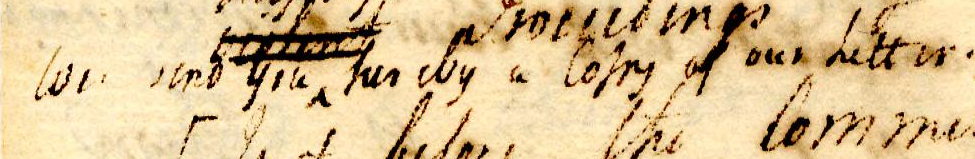We send you hereby a Copy of our Letter.
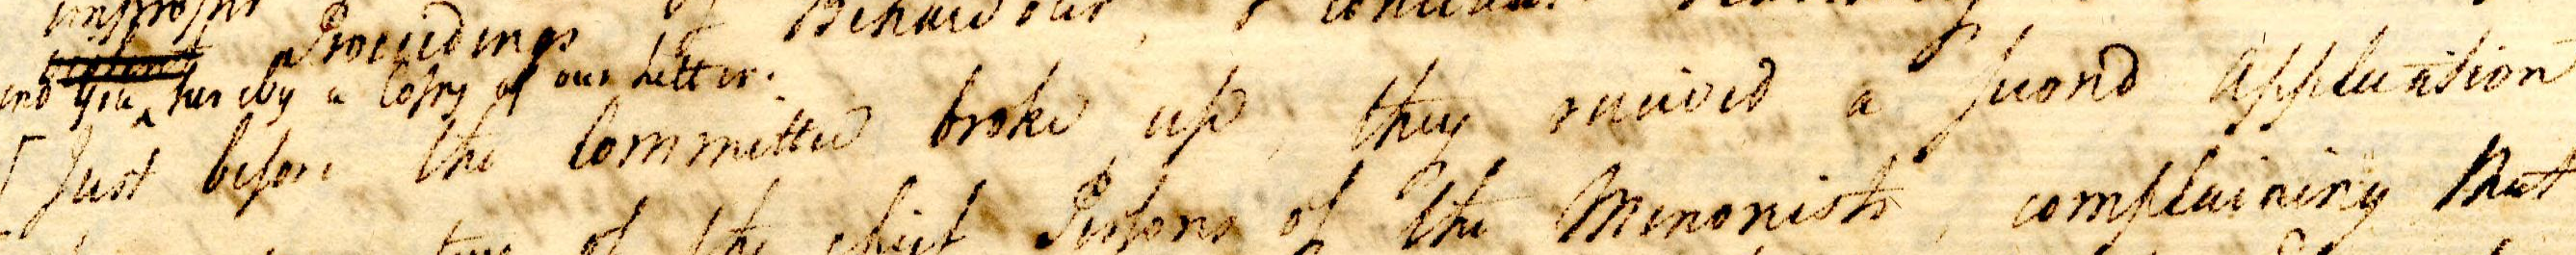(Just before the Committee broke up they received a second Application
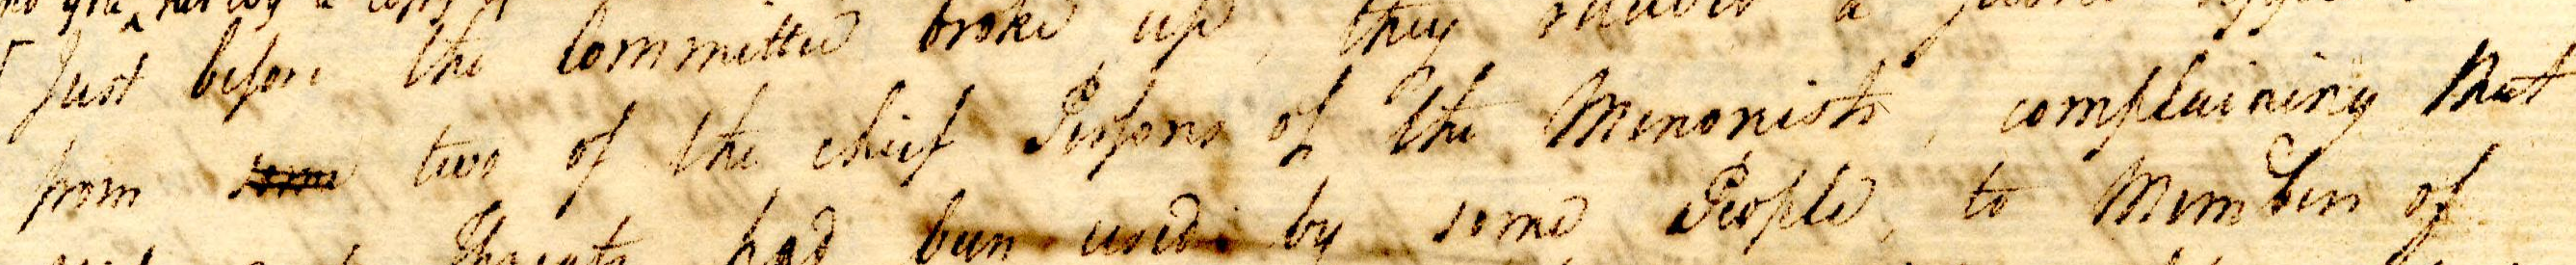from some two of the chief Persons of the Menonists, complaining that
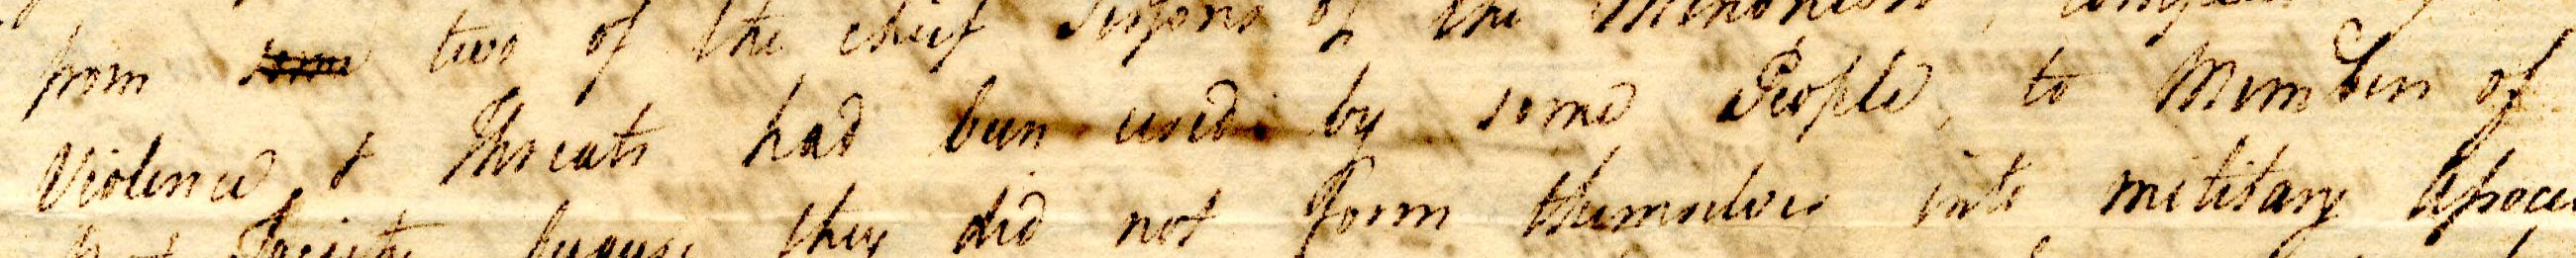Violence & Threats had been used by some People to Members of
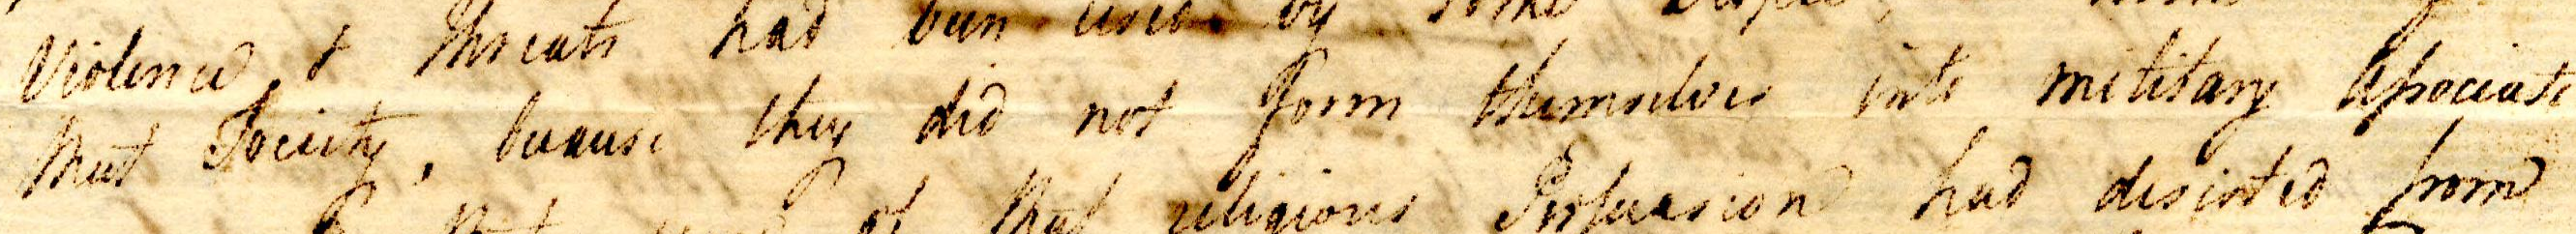that Society, because they did not form themselves into, military associati-
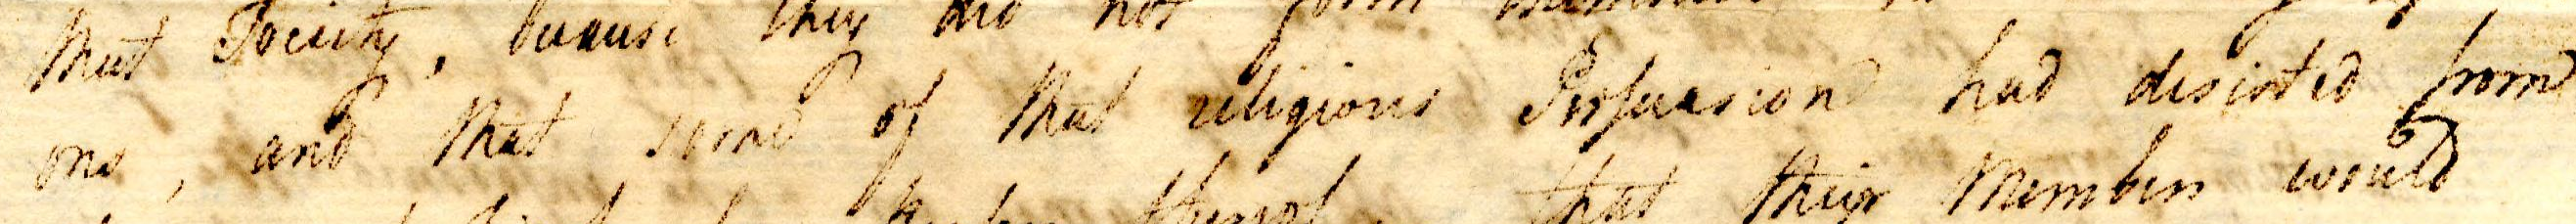-ons, and that some of that religious Persuasion had desisted from
